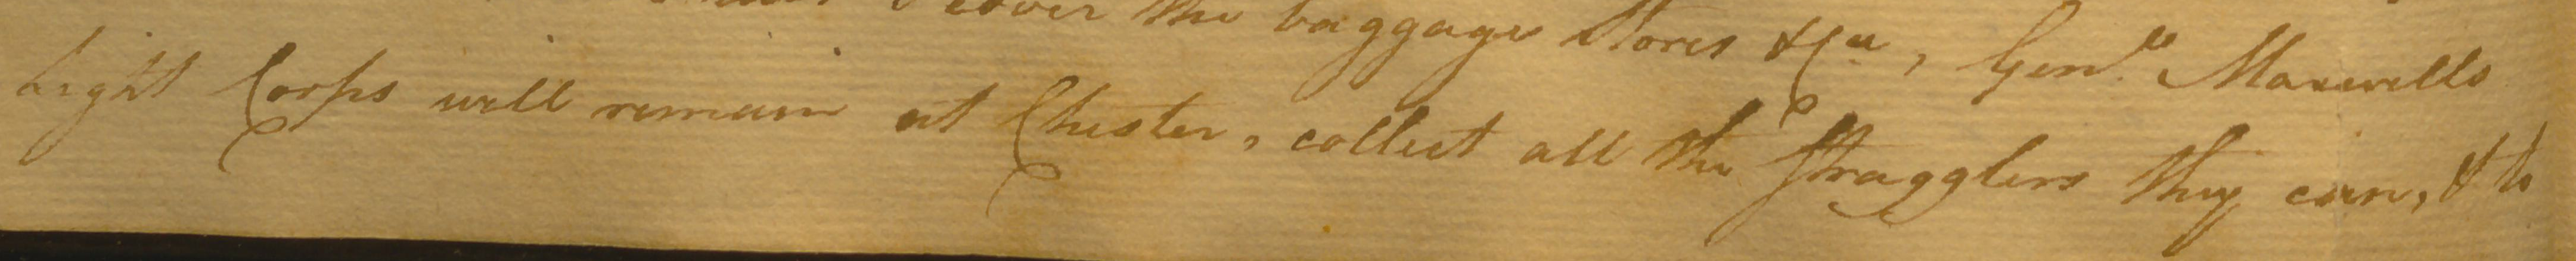Light Corps will remain at Chester, collect all the Stragglers they can, & to
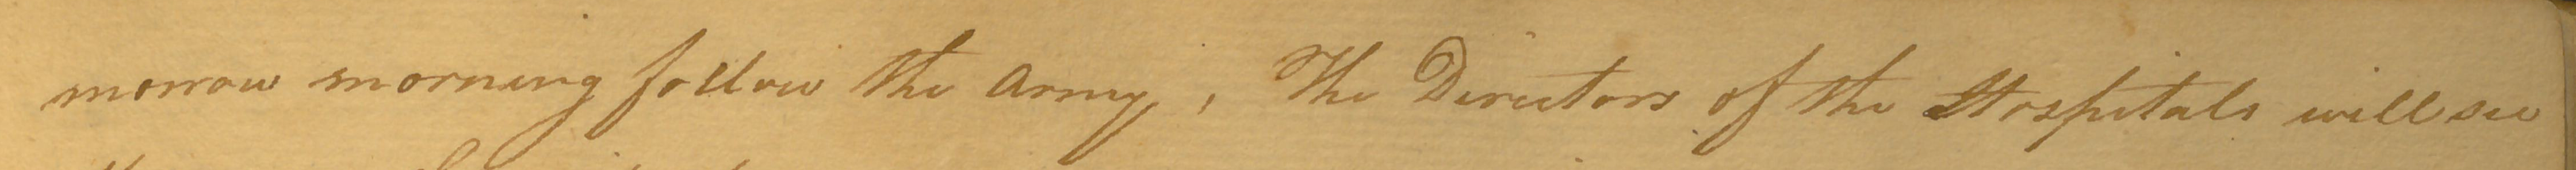morrow morning follow the Army. The Directors of the Hospitals will see
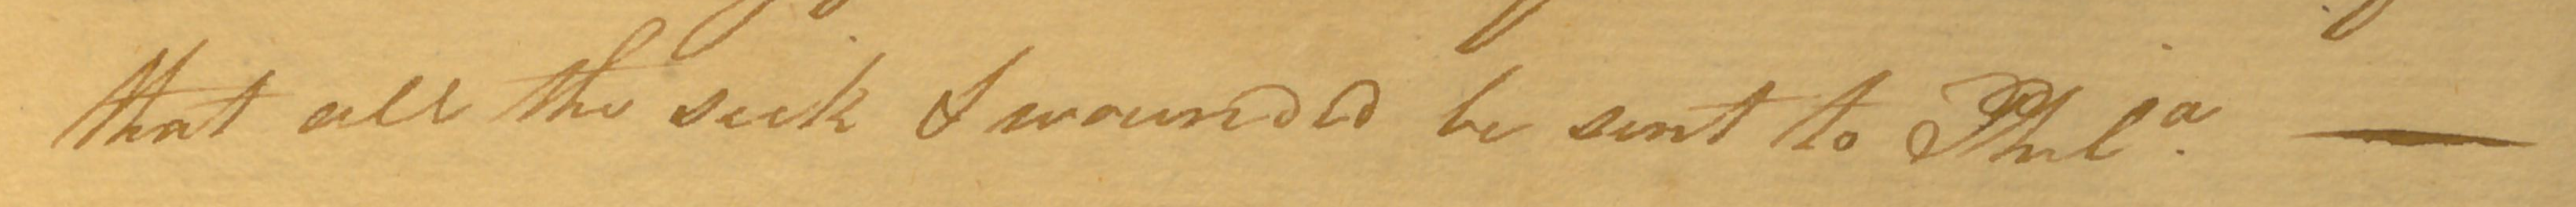that all the sick & wounded be sent to Phil^a.-
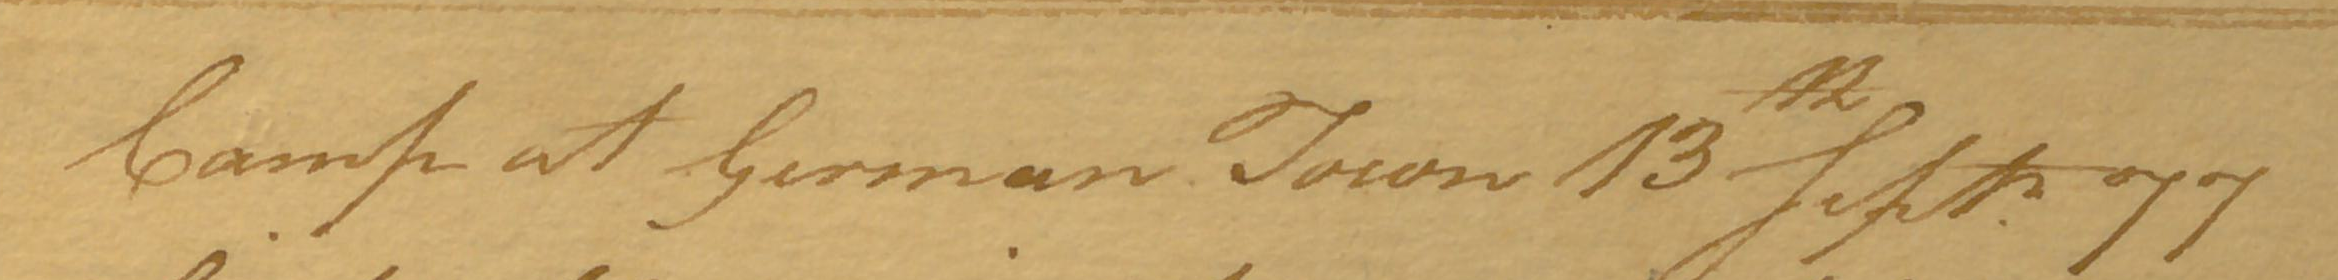Camp at German Town 13^th Sept^r. 77
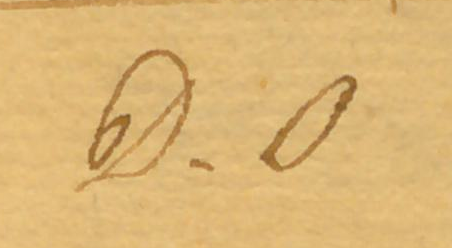D.O
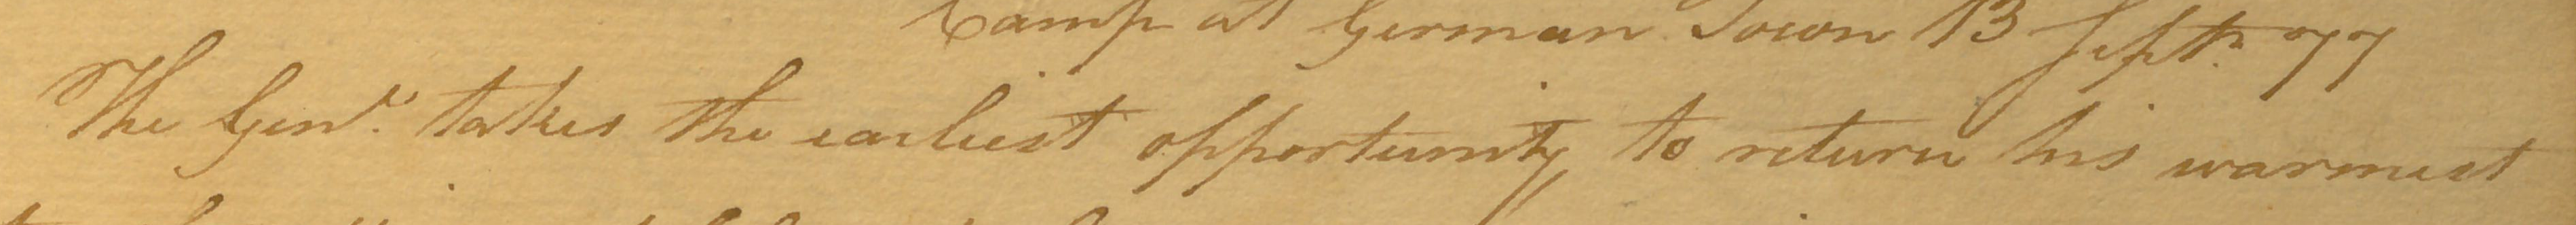The Gen^l. takes the earliest opportunity to return his warmest
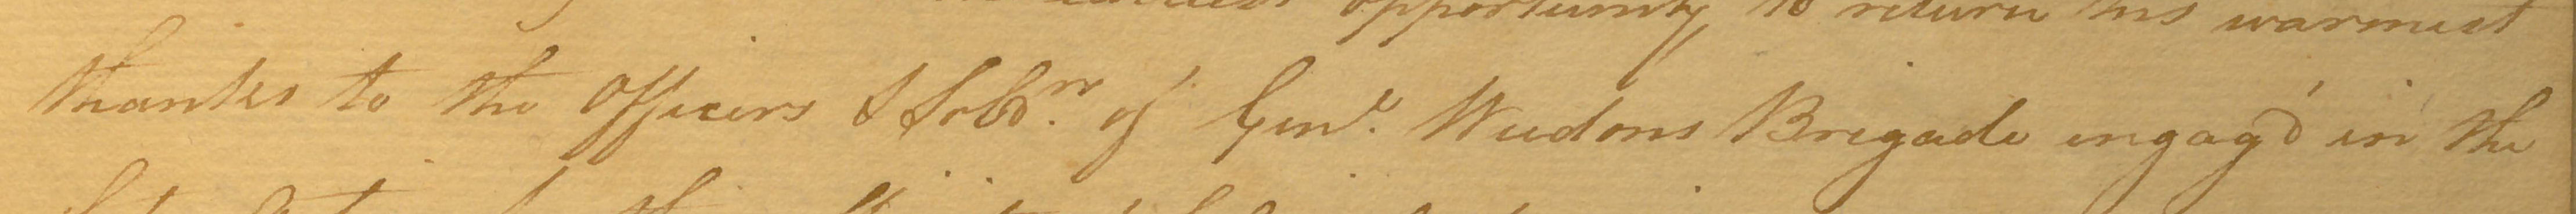thanks to the Officers & Sold^rs. of Gen^l. Weedons Brigade engag'd in the
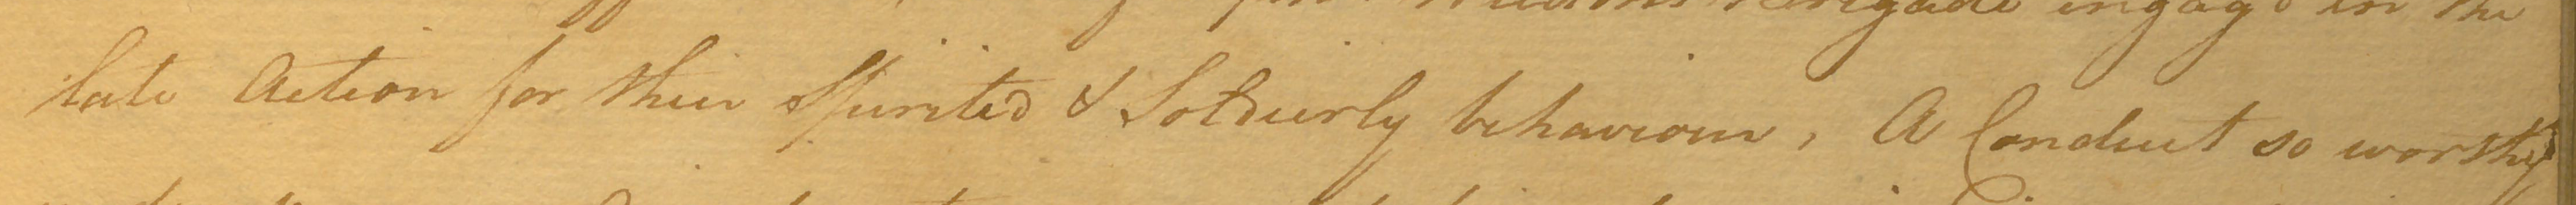late Action for their Spirited & Soldierly behaviour, A Conduct so worthy
